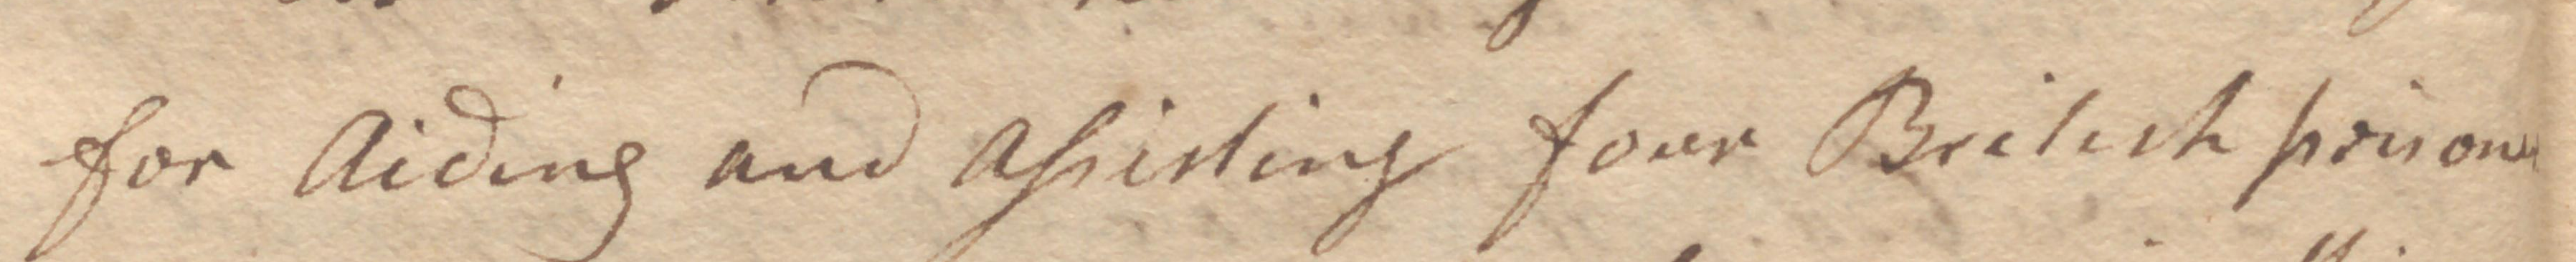for Aiding and assisting four Britich prison
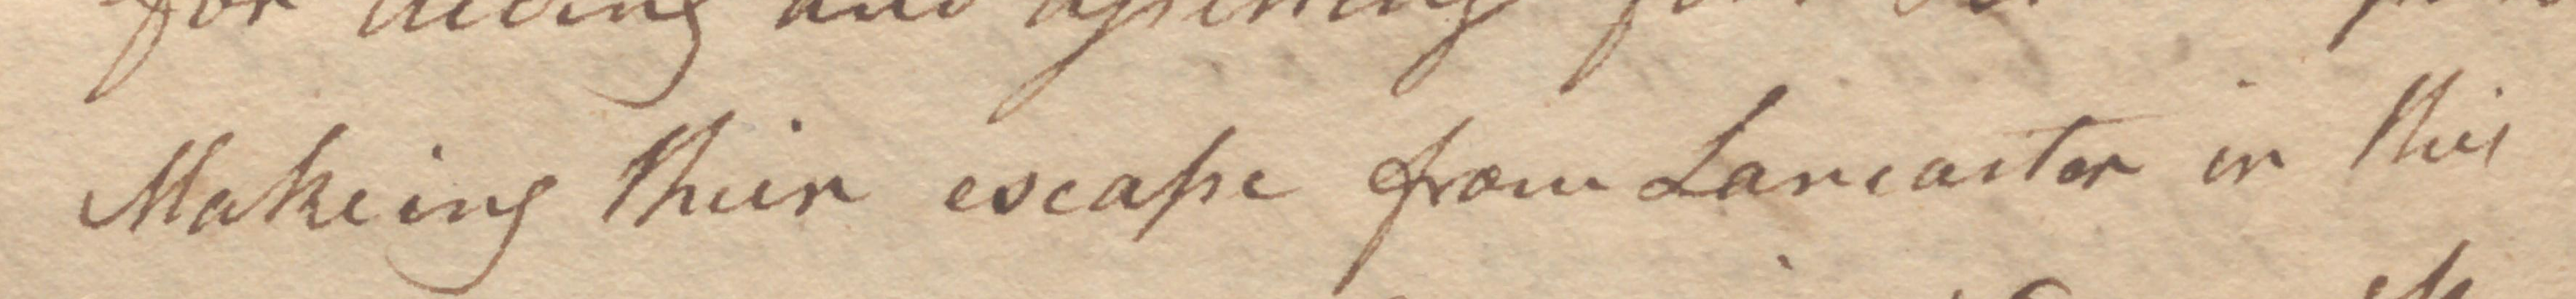Makeing their escape from Lancaster in this
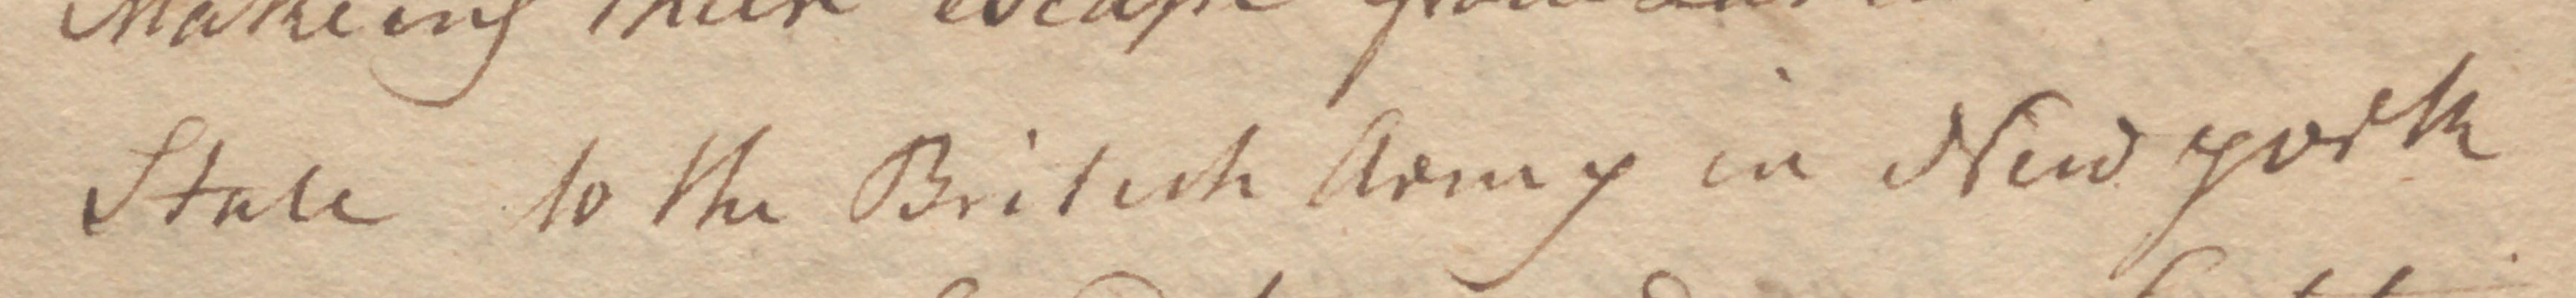Stale to the British Army in New york
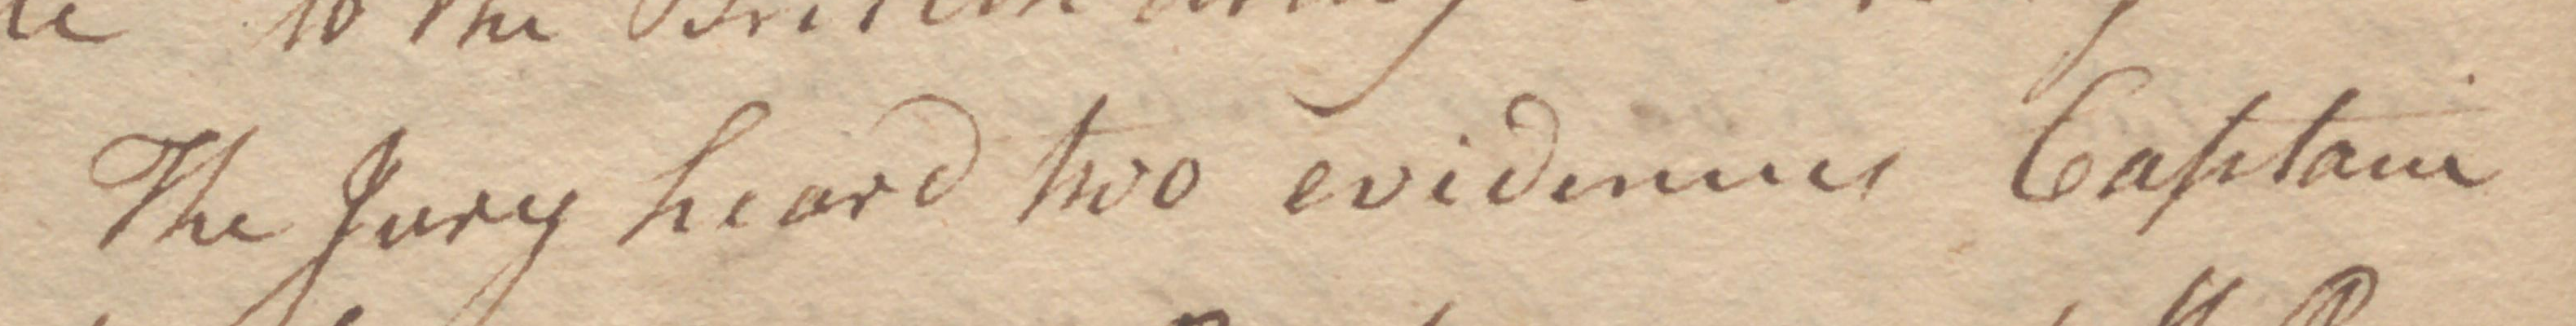The Jury heard two evidences Captain
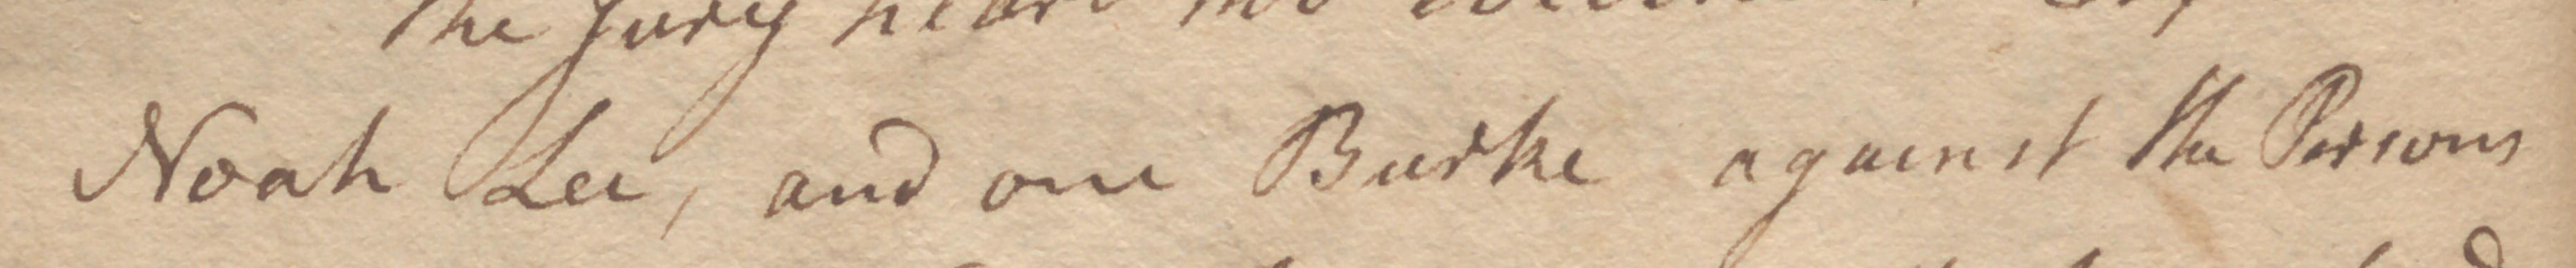Noak Lee, and one Burke against the Persons
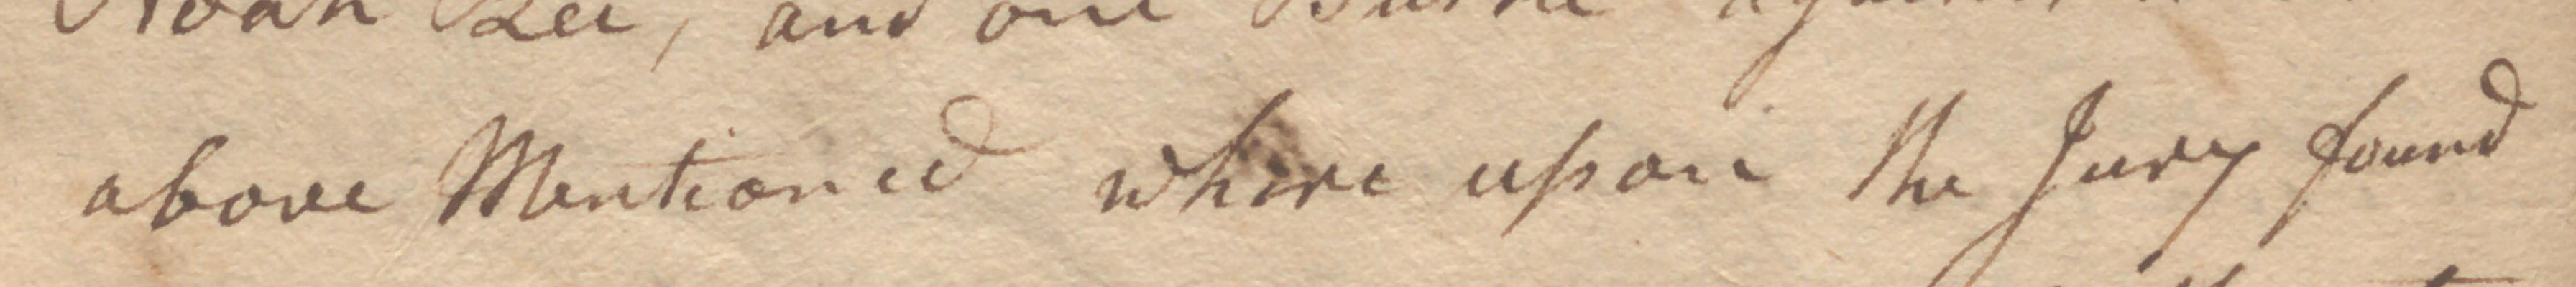above Mentioned where upon the Jury found
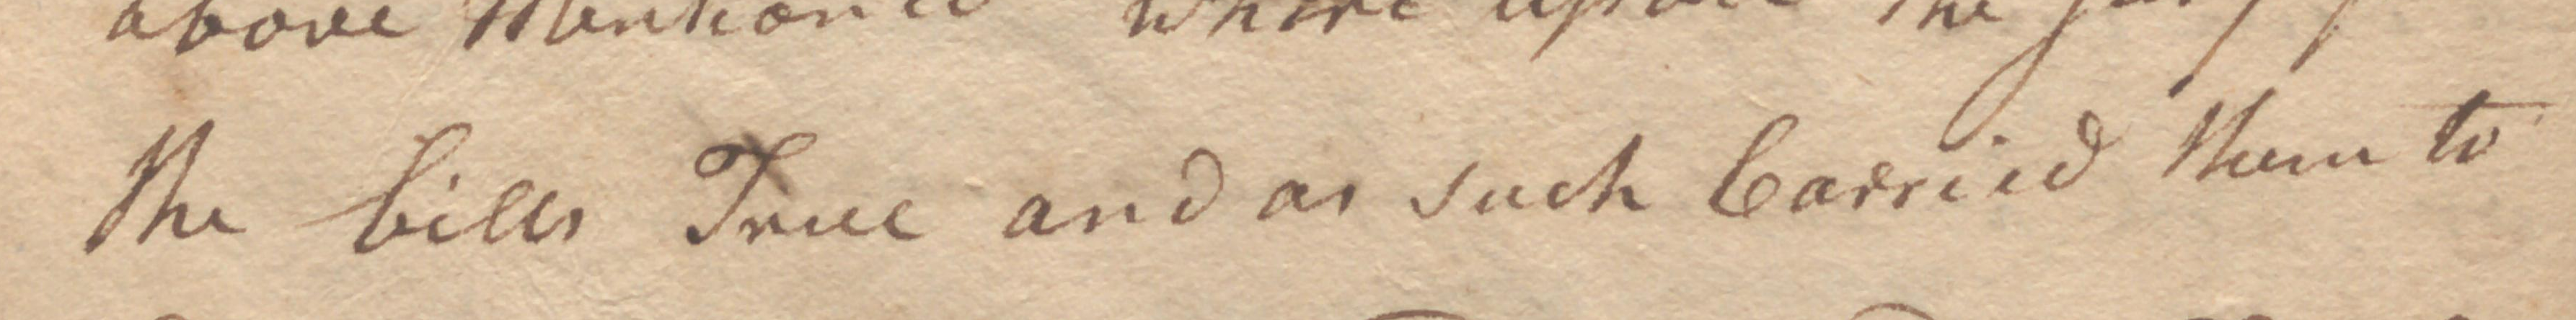the bills True, and as such Carried them to
